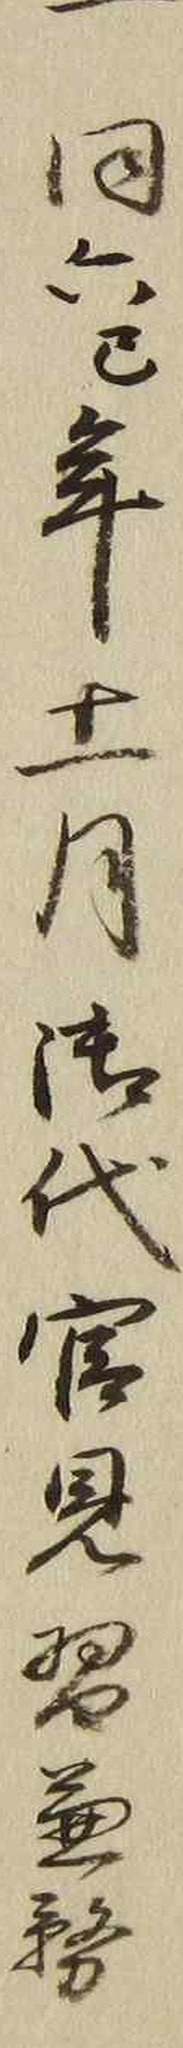一同六巳年十一月御代官見習兼務
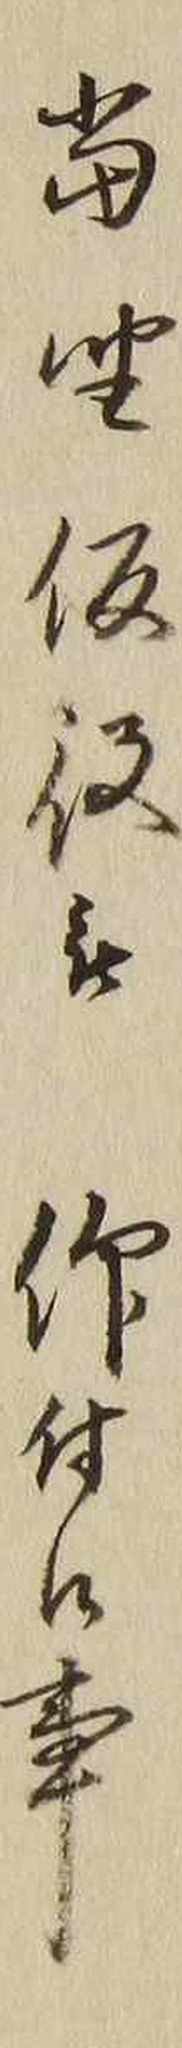当坐仮役被仰付候事
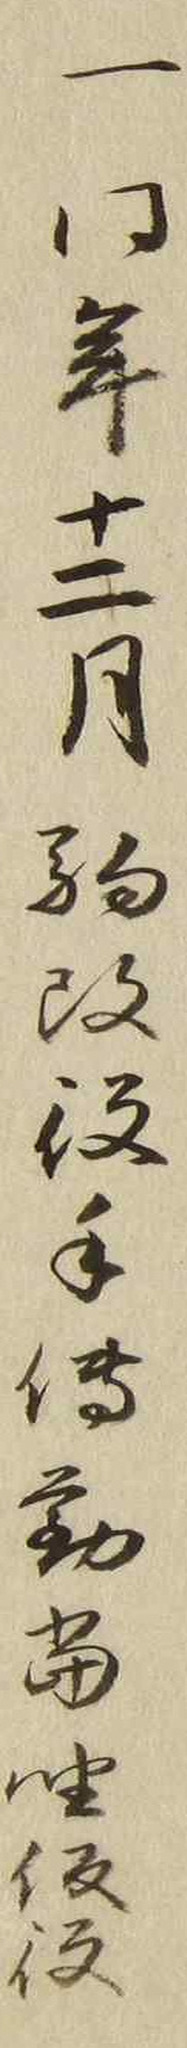一同年十二月駒改役手伝勤当坐仮役
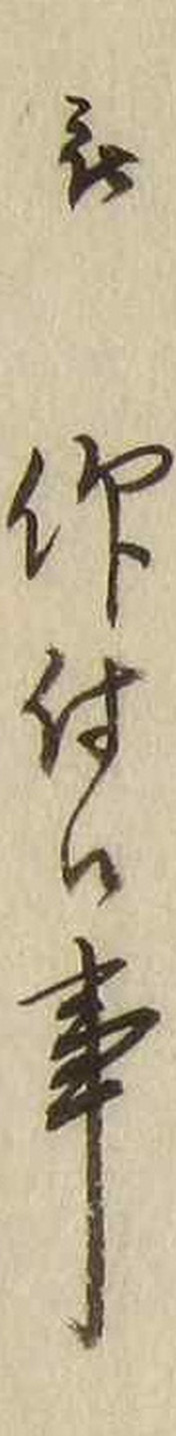被仰付候事

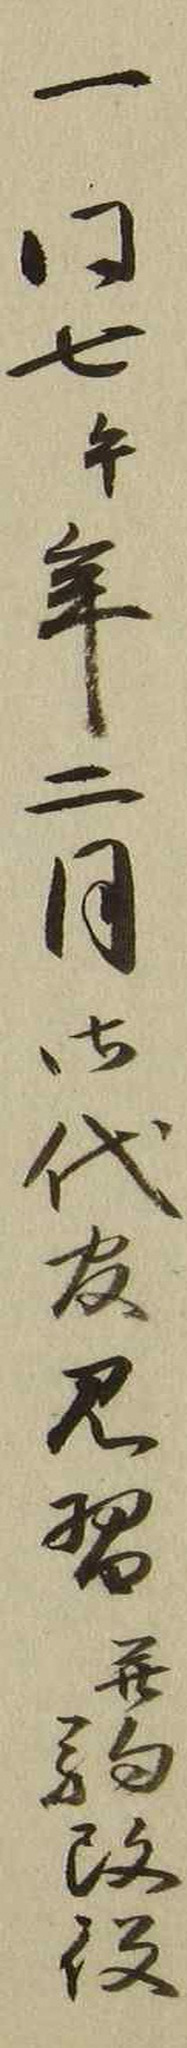一同七午年二月御代官見習幷駒改役
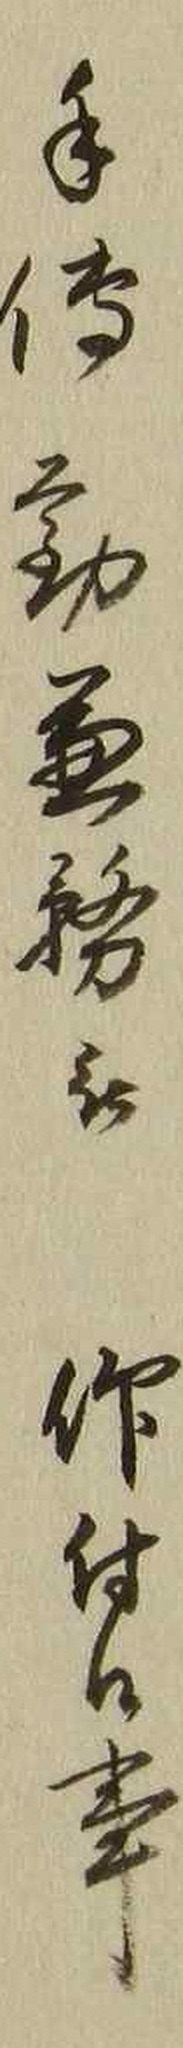手伝勤兼務被仰付候事
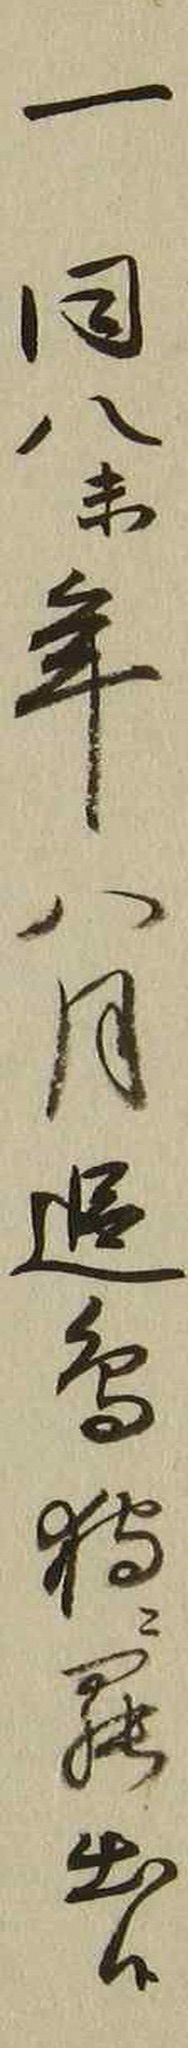一同八未年八月追鳥狩ニ罷出候
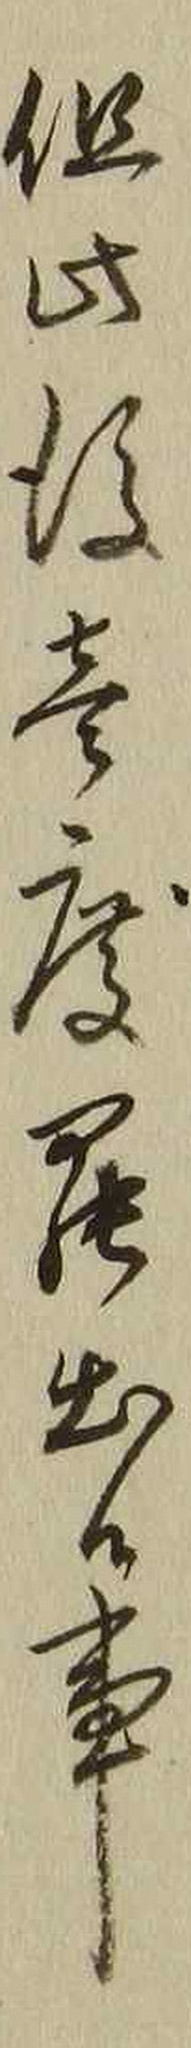但此後壱度罷出候事
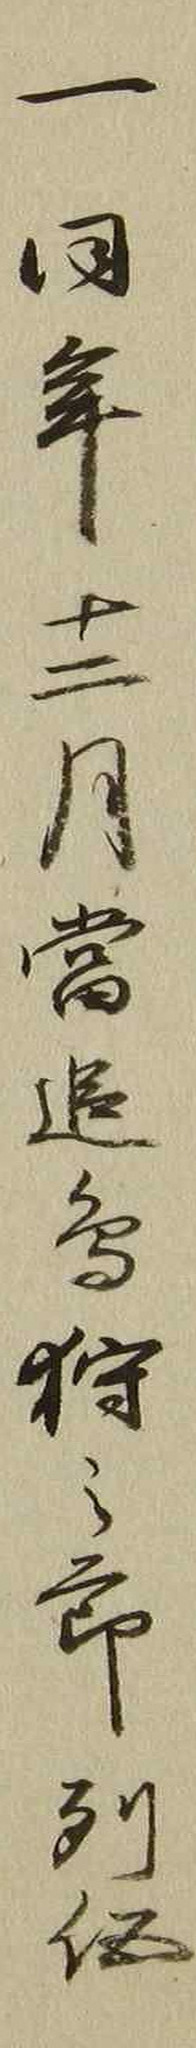一同年十二月当追鳥狩之節列伍
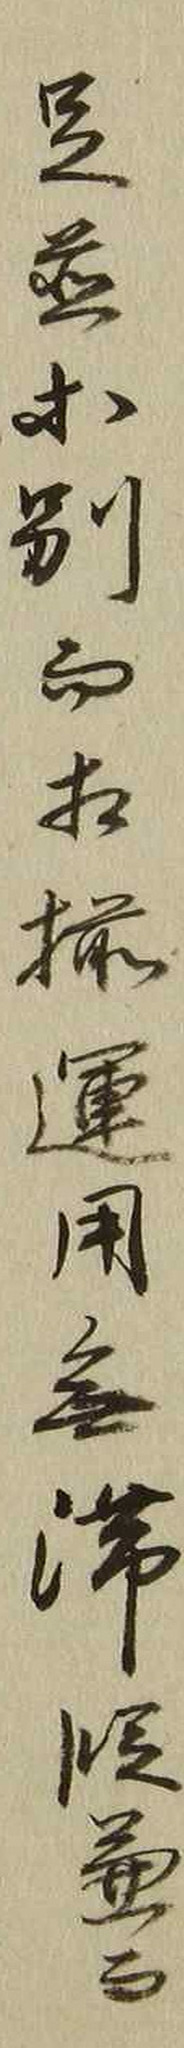足置等別而相揃運用無滞段兼而
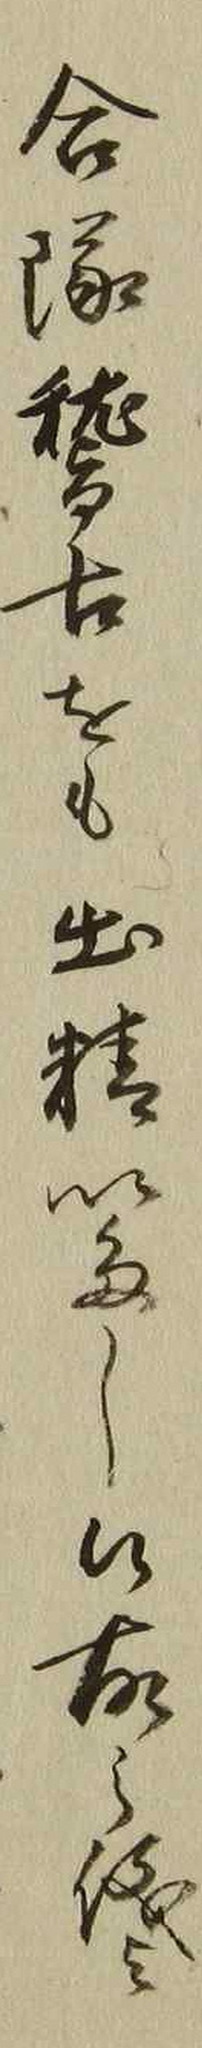合隊稽古をも出精いたし候故之儀与
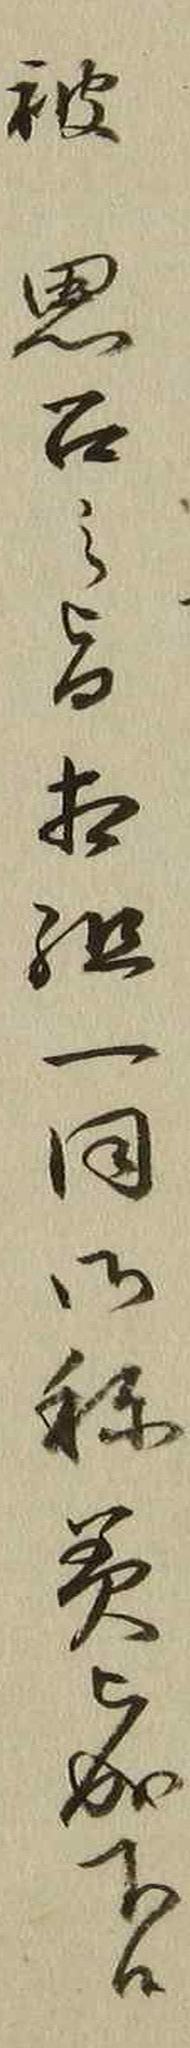被思召之旨相組一同御称美被成下候
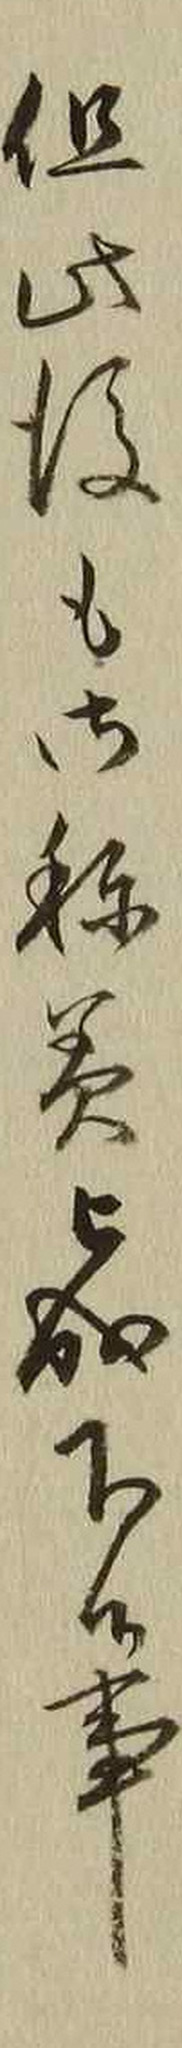但此後も御称美被成下候事
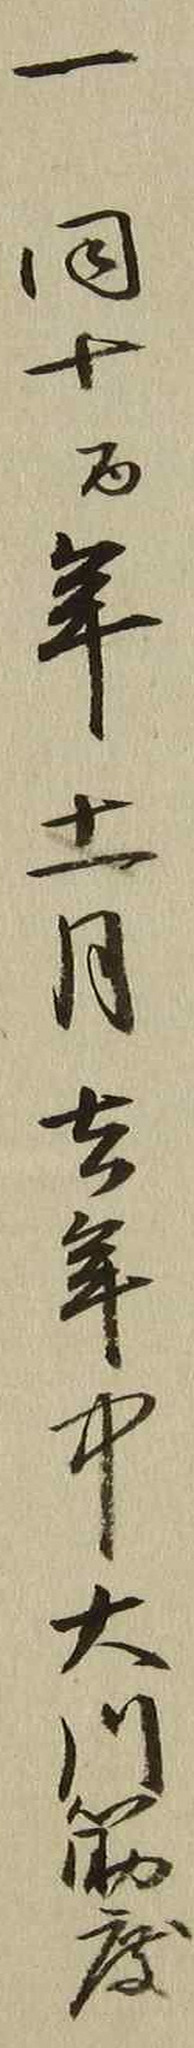一同十酉年十一月去年中大川筋度
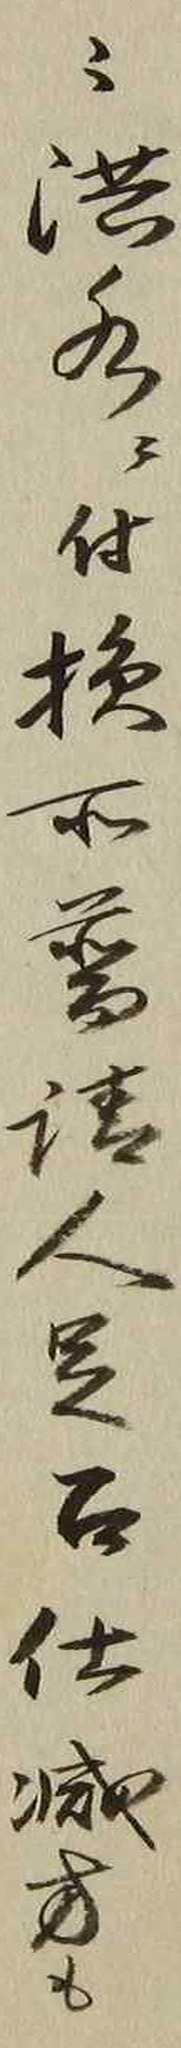々洪水ニ付損所普請人足召仕減方も
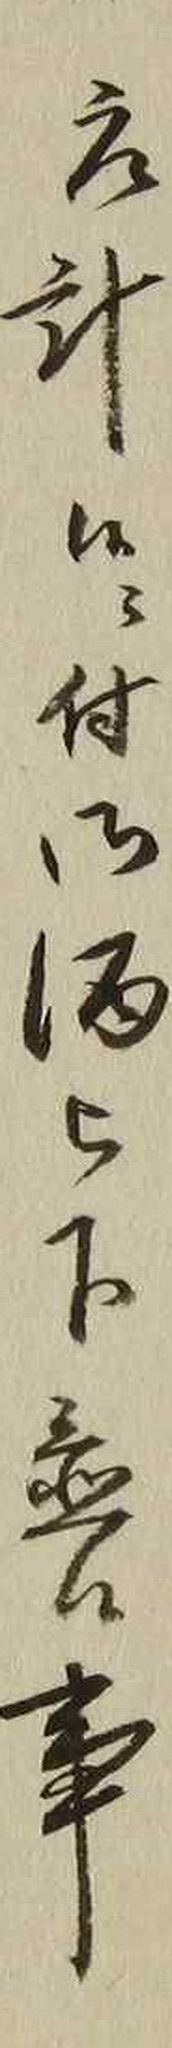取計候ニ付御酒被下置事
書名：諸士系譜　巻之128　た之部4
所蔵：会津若松市立会津図書館
